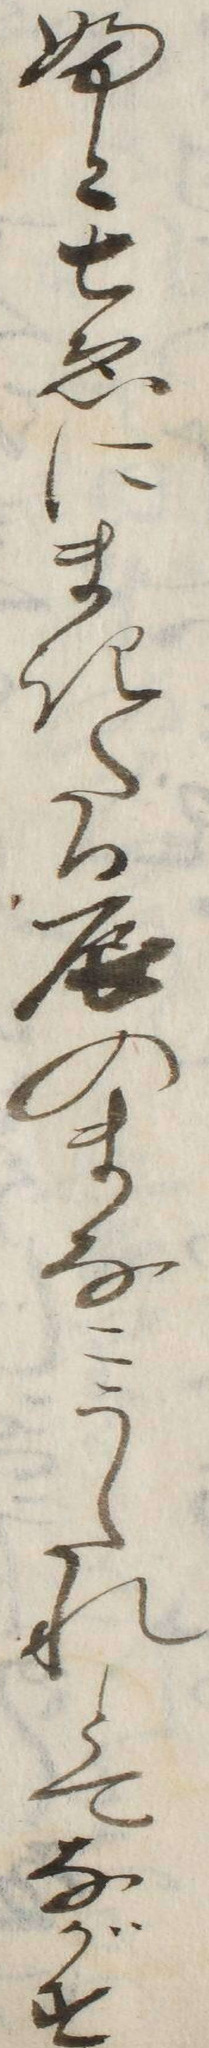ふと七ゑにまきたる辰のまなこうたれとてながす
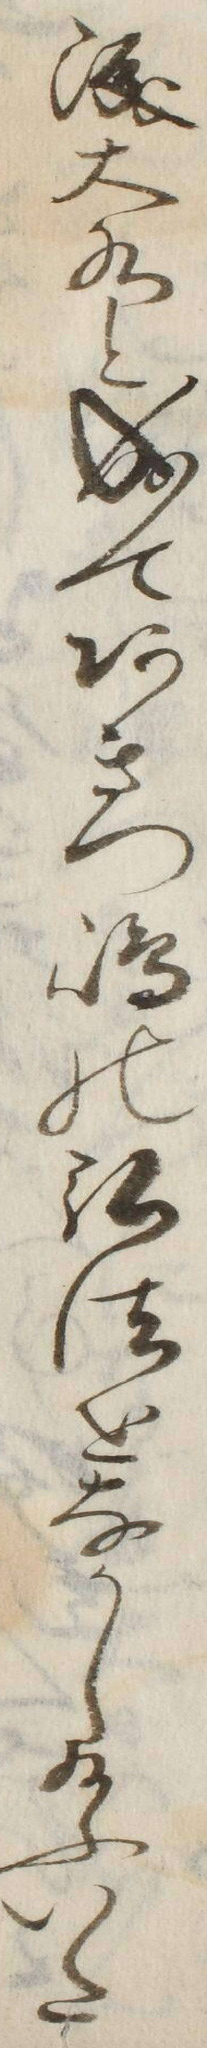涙大水と成てあまつ島の弘法となし給ふいた
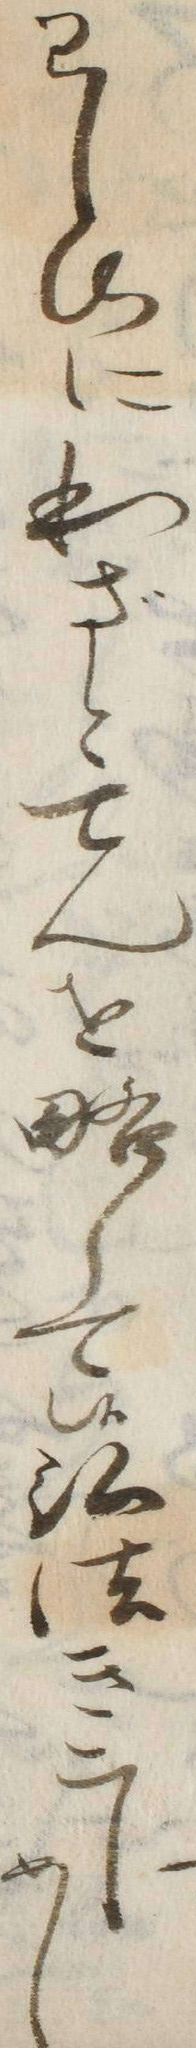わしめにわざとてんを略して弘法きこしめし
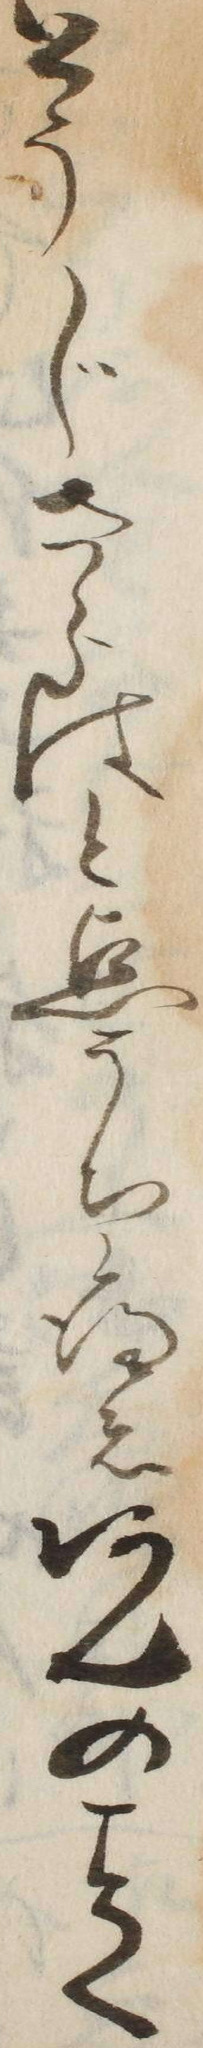とうじさらはと点うち候得はあんのことく
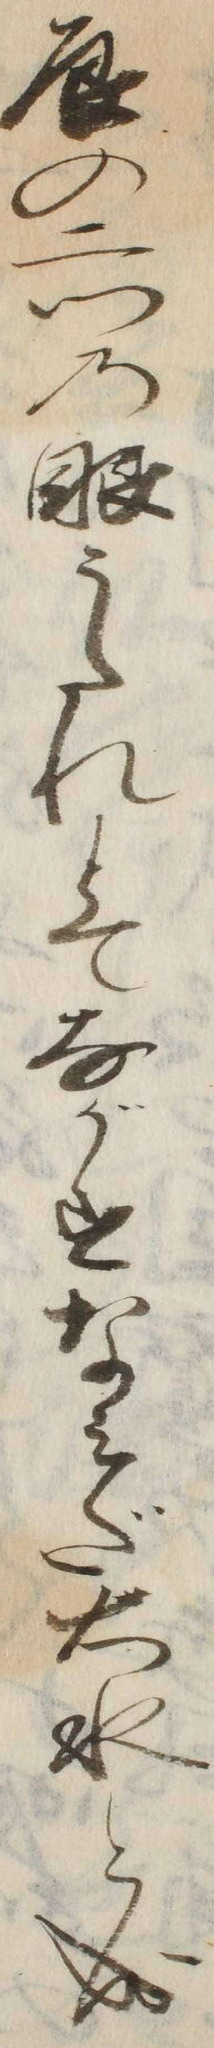辰の二つの眼うたれとてながすなみだ大水と成
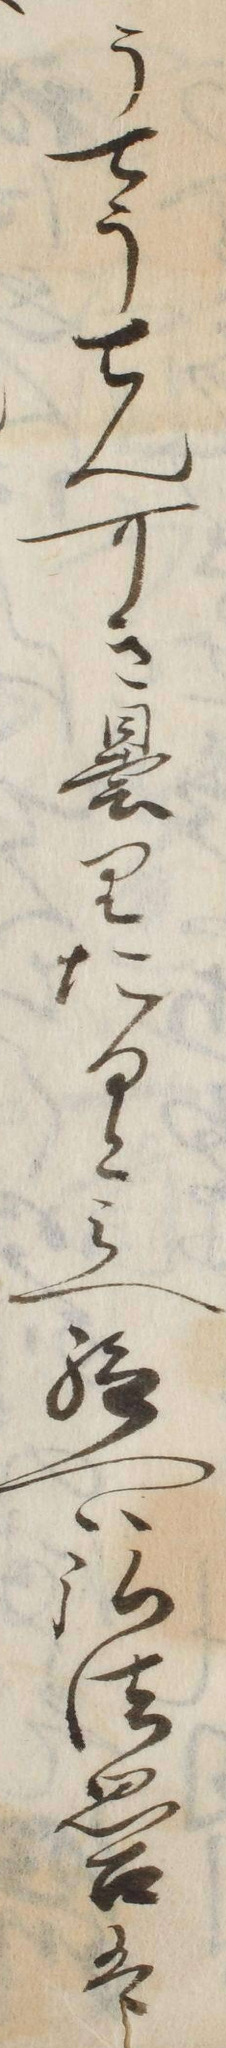うてうてんかき曇りたるとみへ給へは弘法思召は
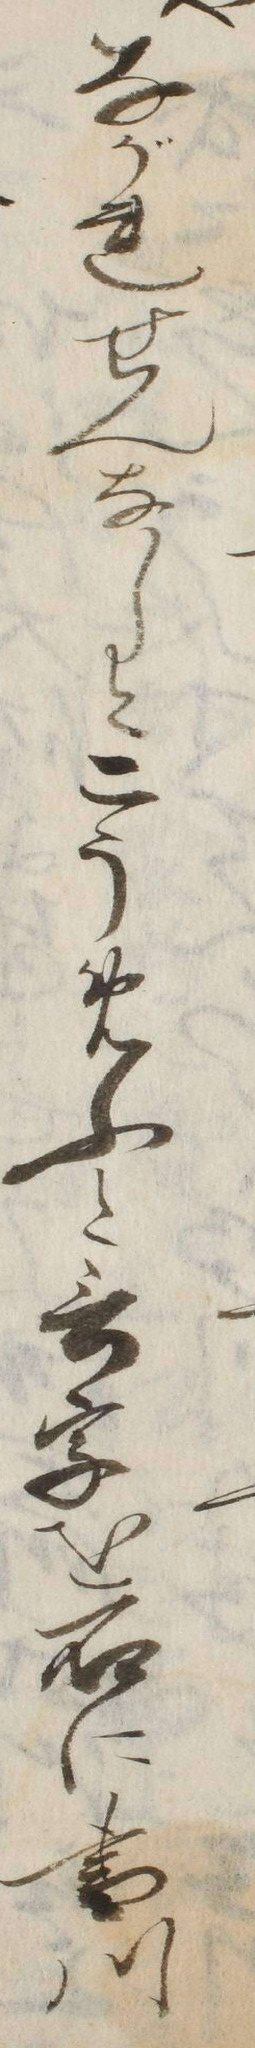いやながれせんなしとこうめふと言字を石に書川
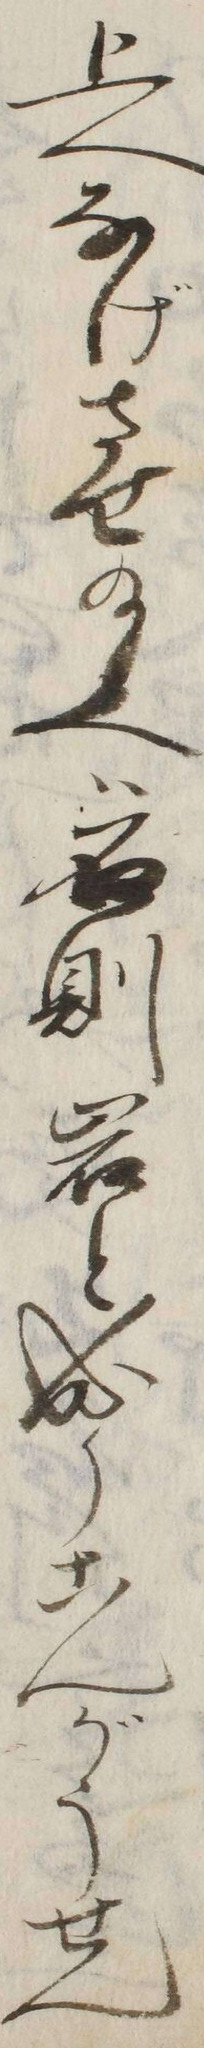上へなげさせ給へは石則岩と成りこんがうせん
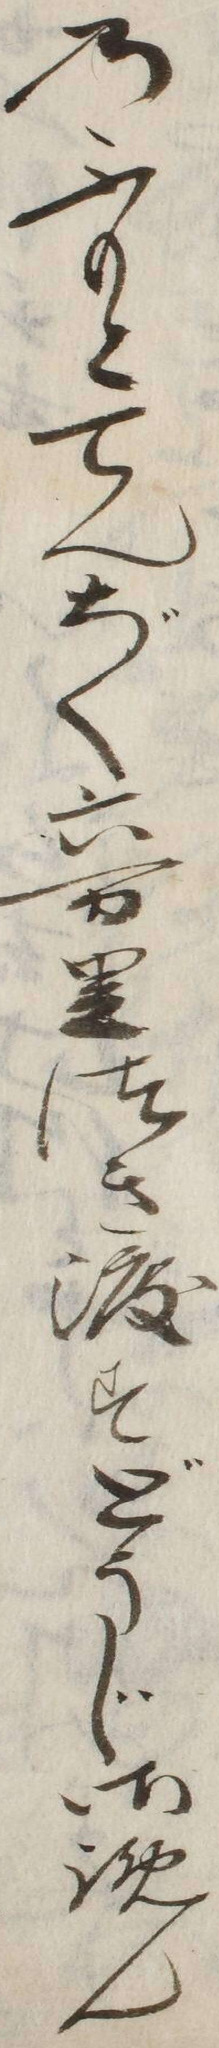のふもとてんぢく六万里つき渡すどうじ御覧ん
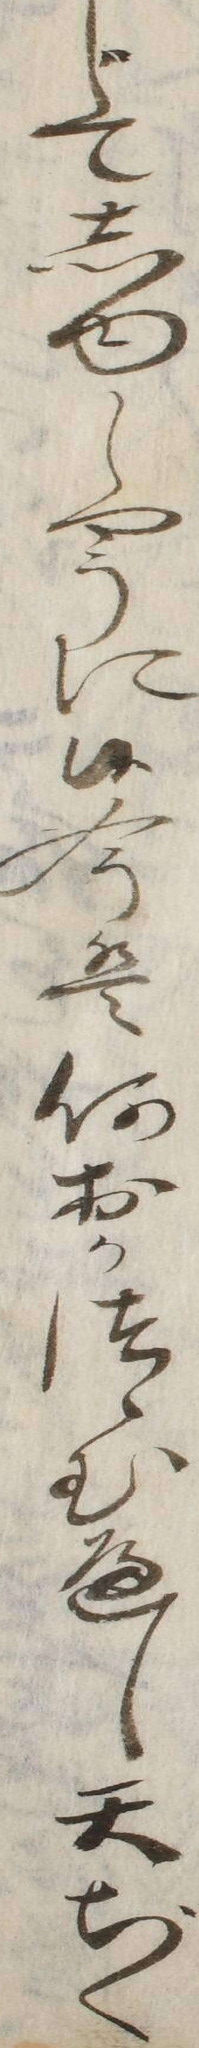してしゆしやうに候今は何おかつゝむへし天ぢく
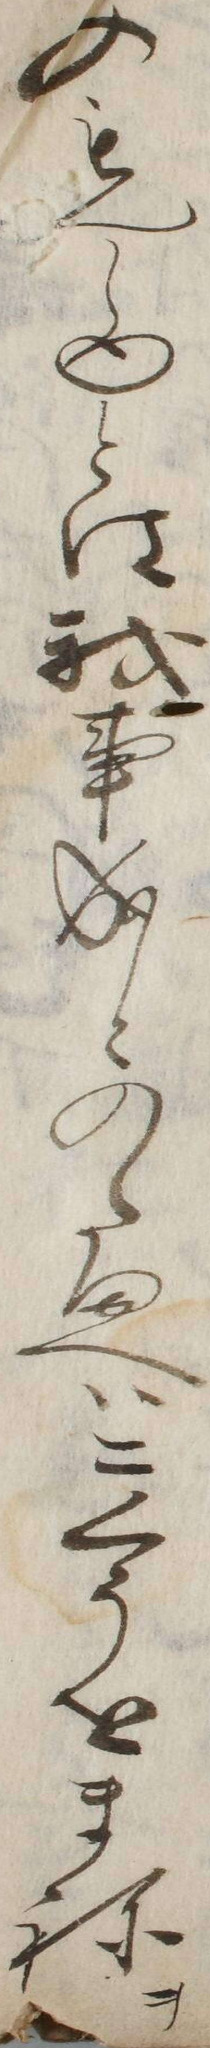のもんしゆとは我事成とのたまへはこくうをまねを
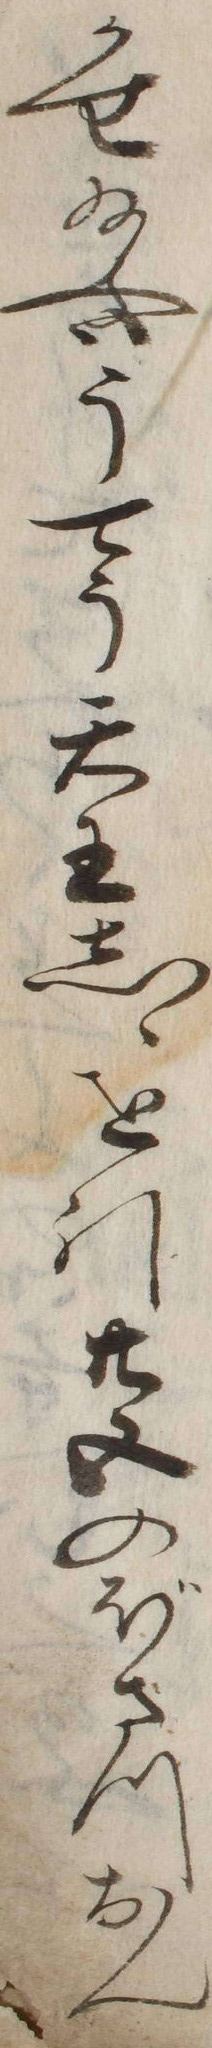かせ給へはうてう天王しゝを引廿五のぼさつおん

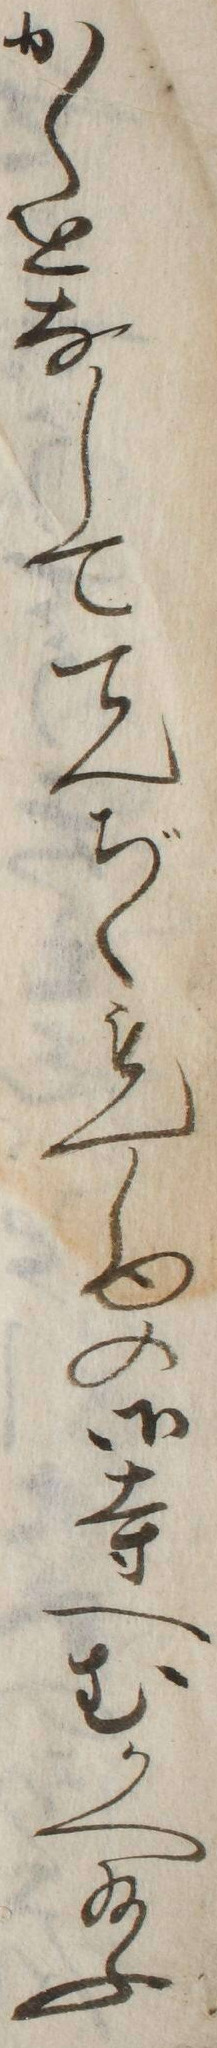かくをなしてんぢくもんしゆの御寺へむかへ給ふ
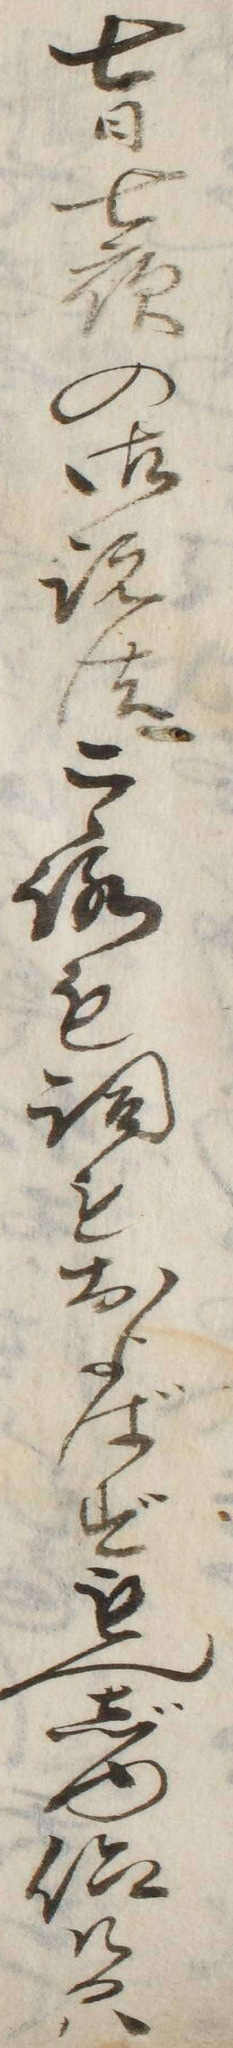七日七夜の御説法こゝろも詞もおよばずもんじゆ仰けるは
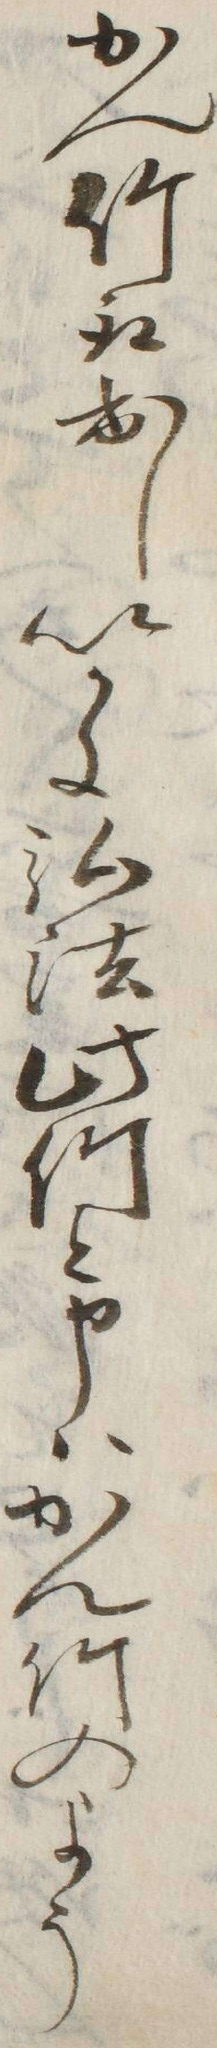かん竹取出しいかに弘法此竹と申はかん竹のよう
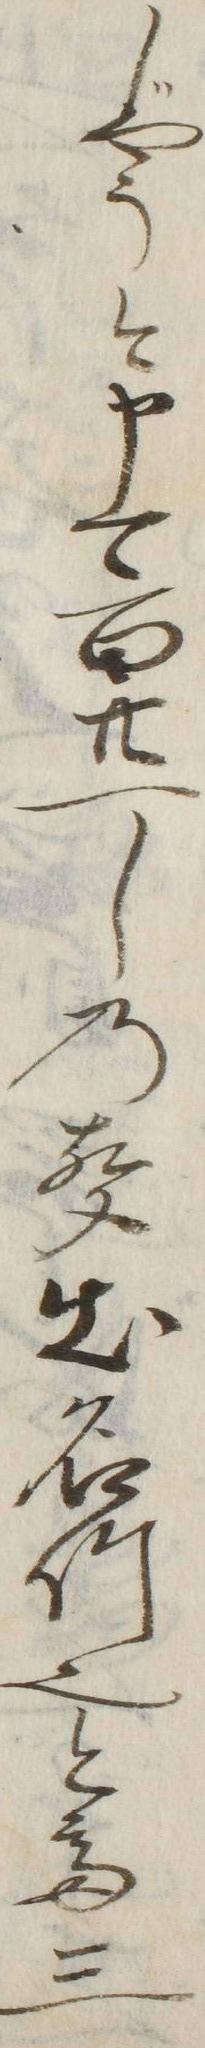じやうと申て百廿一しの声出名竹也とて三
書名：奉弘法大師御傳記
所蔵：国文学研究資料館
